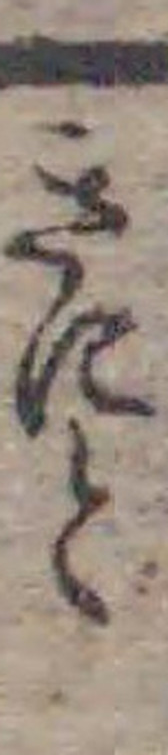きにと
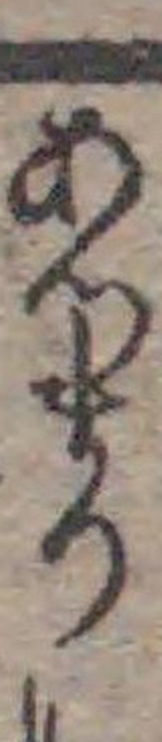あつまり
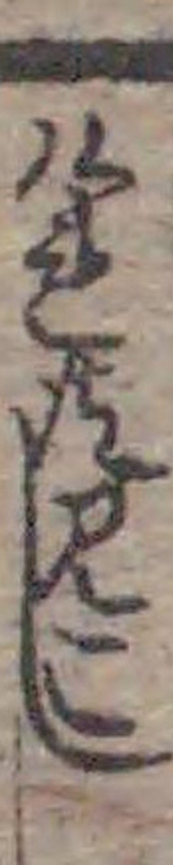けれ共みこし
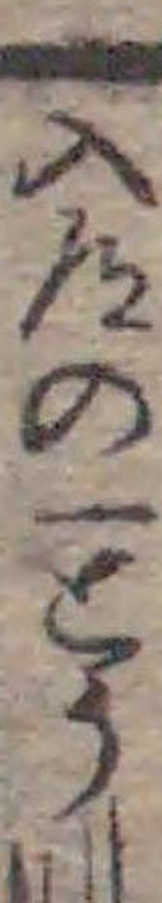入道の一とう
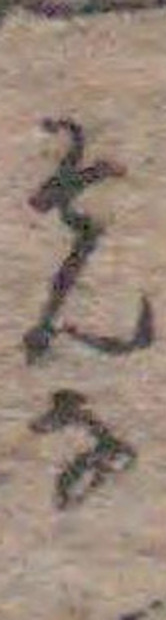そんな
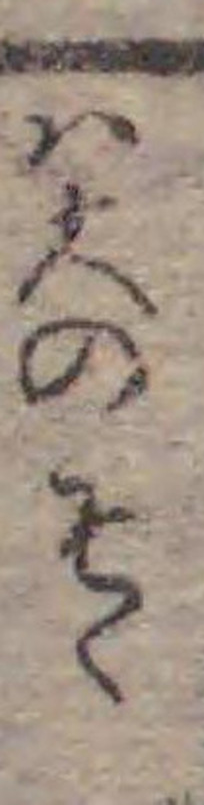は大のそく
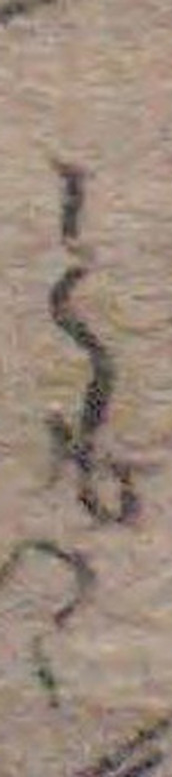ともいゝ
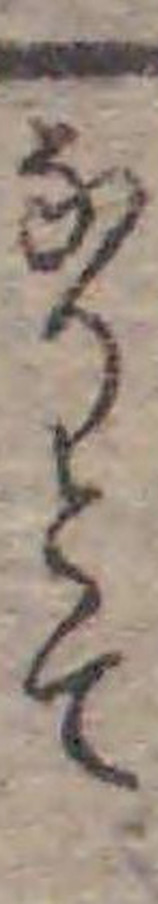なりとて
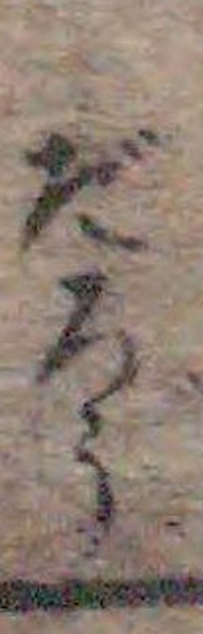だろう
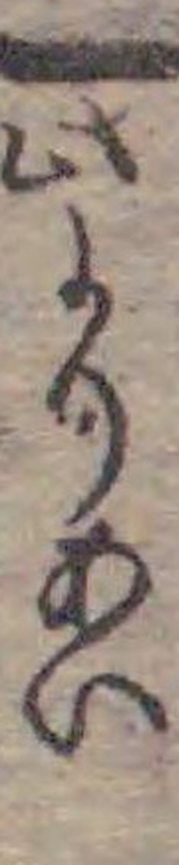此よりあい
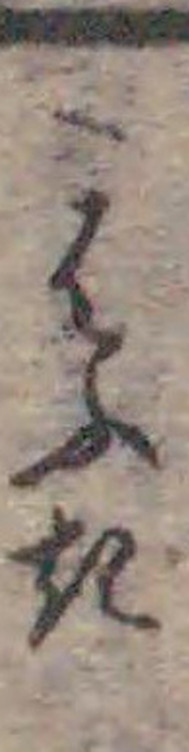はふき

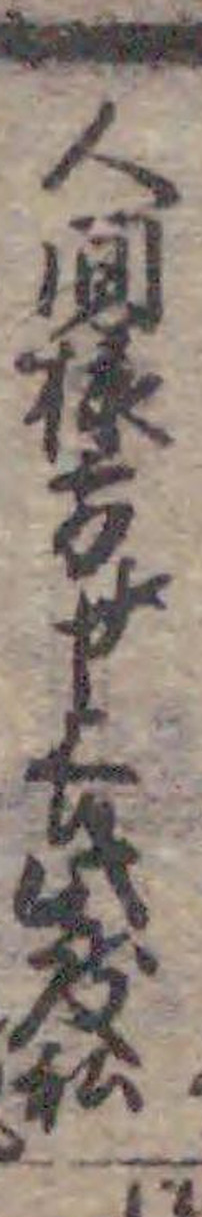人間様方申上候此度私
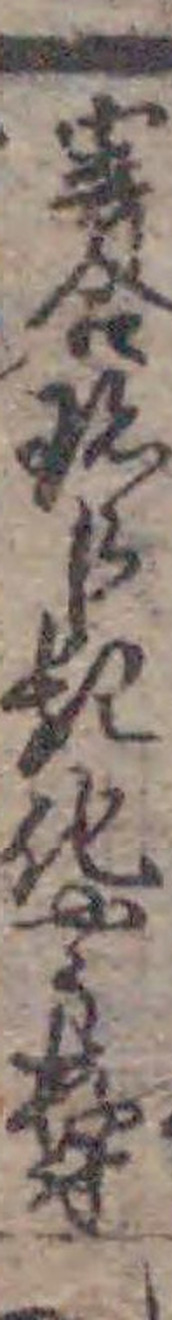寄合珍らしき化やう存付
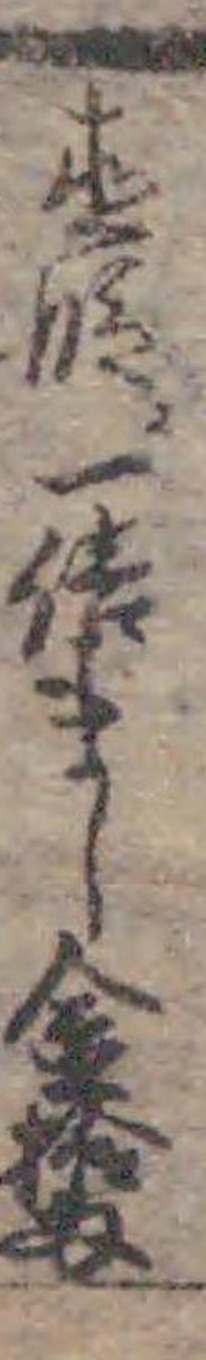直段一倍まし金拾両
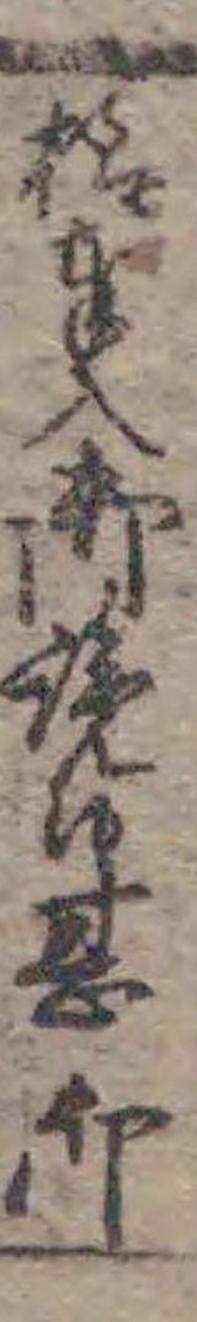様奉入御覧候甚御
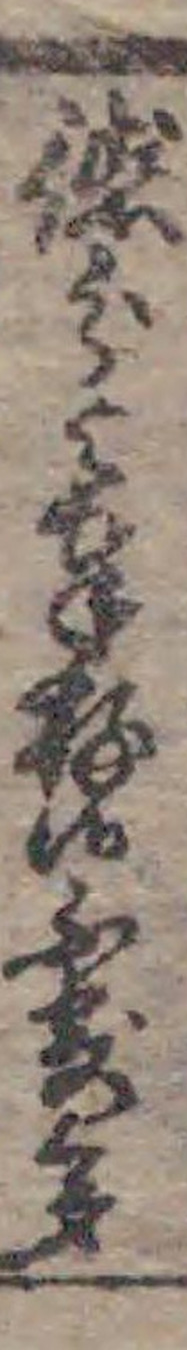徳分と奉存候不寄多
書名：紺屋百物語 : 3巻
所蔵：国立国会図書館 National Diet Library, JAPAN
